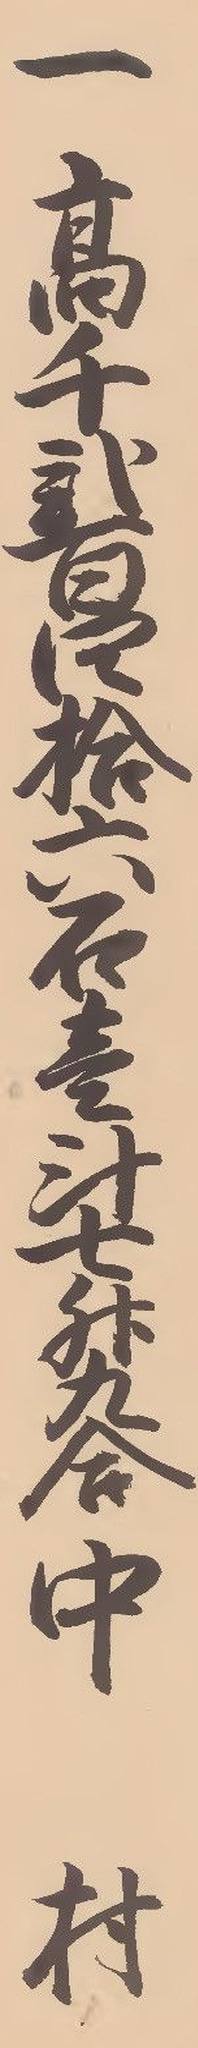一高千弐百四拾六石壱斗七升九合中村

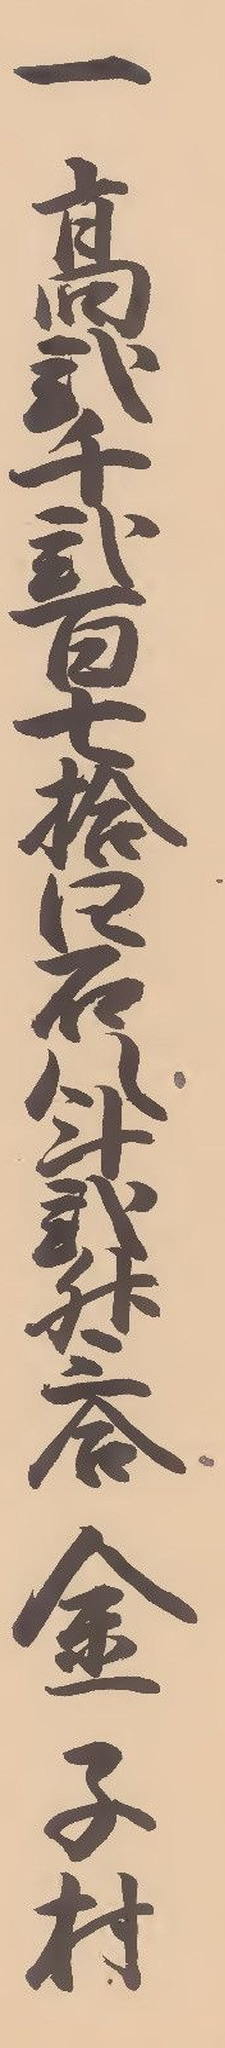一高弐千弐百七拾四石八斗弐庄三合金子村
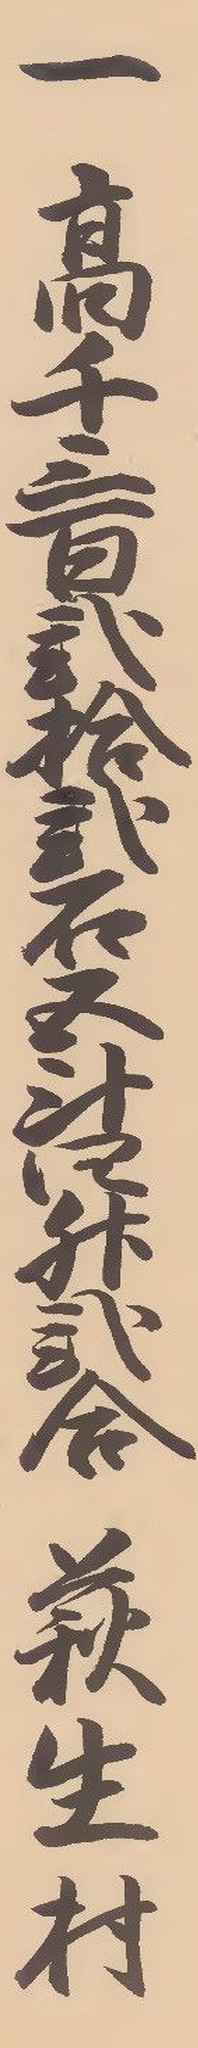一高千三百弐拾弐石五斗四升弐合萩生村
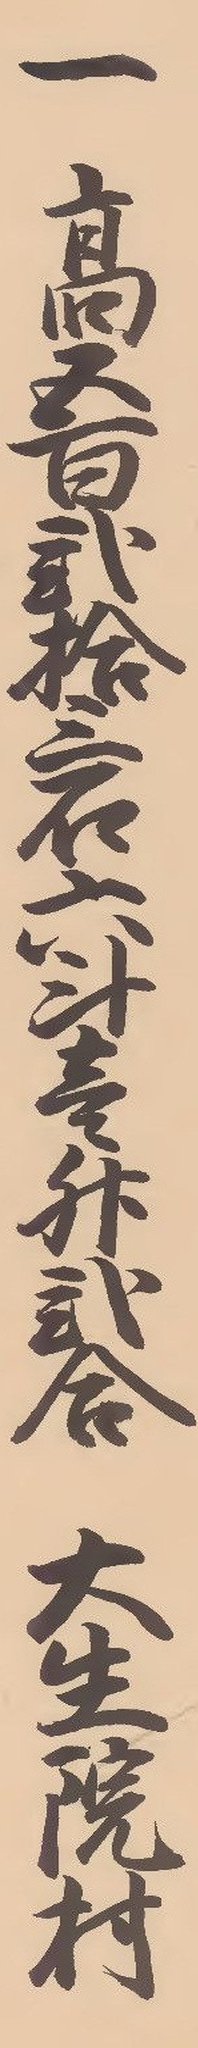一高五百弐拾三石六斗壱升弐合大生院村
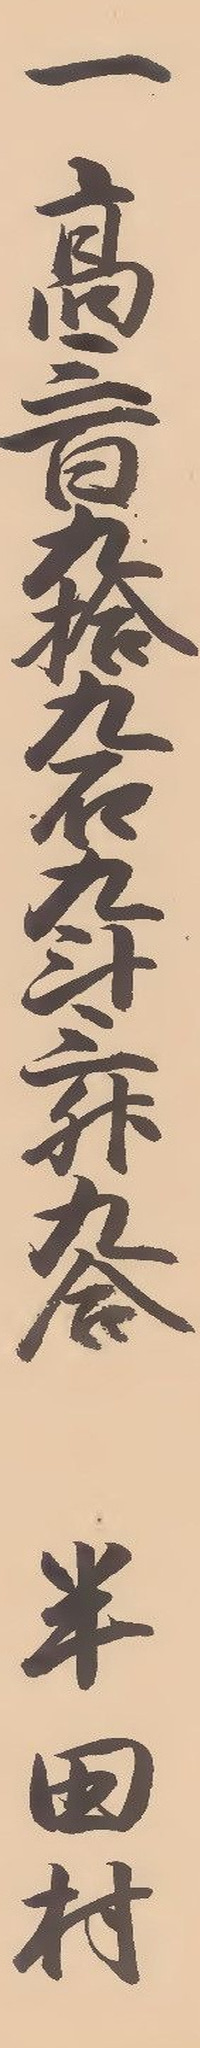一高三百九拾九石九斗三升九合半田村
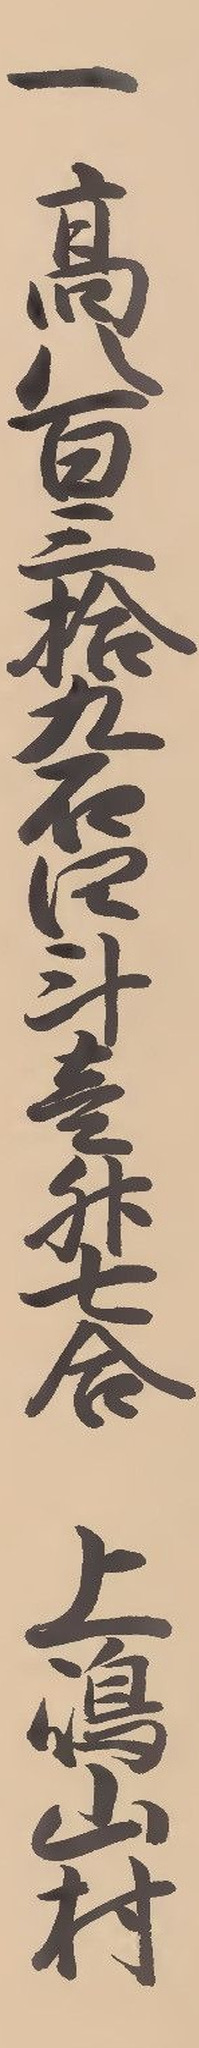一高八百三拾九石四斗壱升七合上島山村
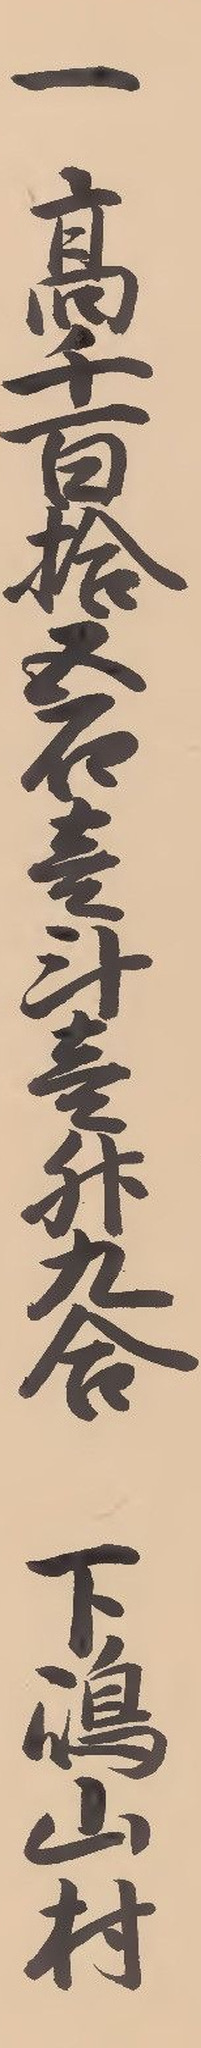一高千百拾五石壱斗壱升九合下島山村
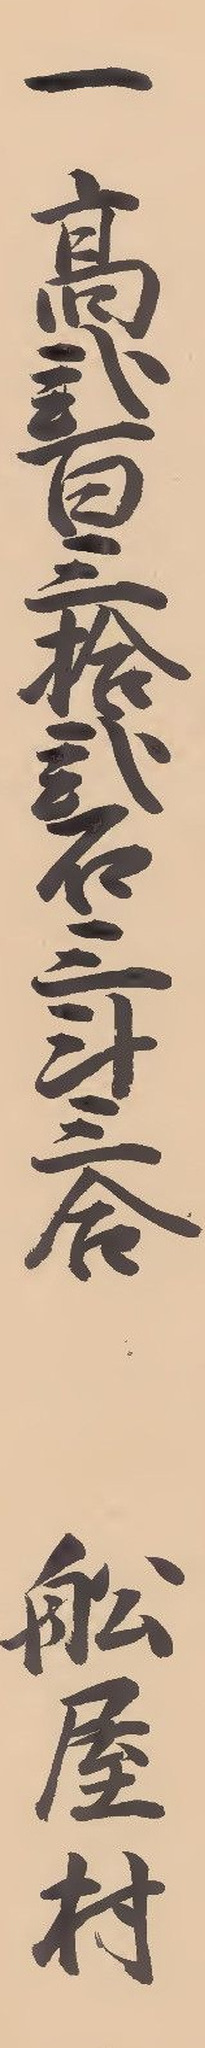一高弐百三拾弐石三斗三合船屋村
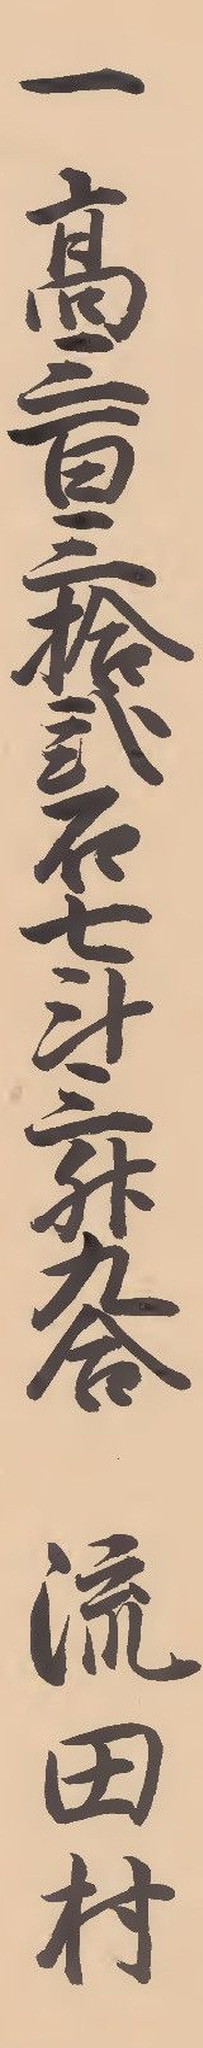一高三百三拾弐石七斗三升九合流田村

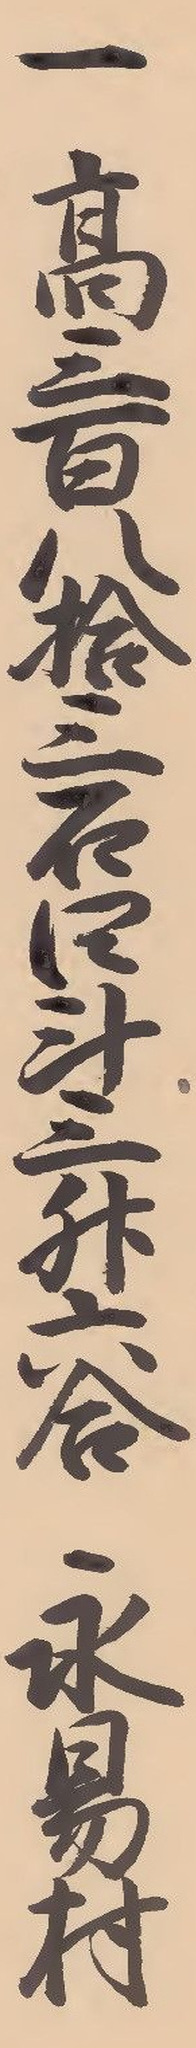一高三百八拾三石四斗三升六合永易村
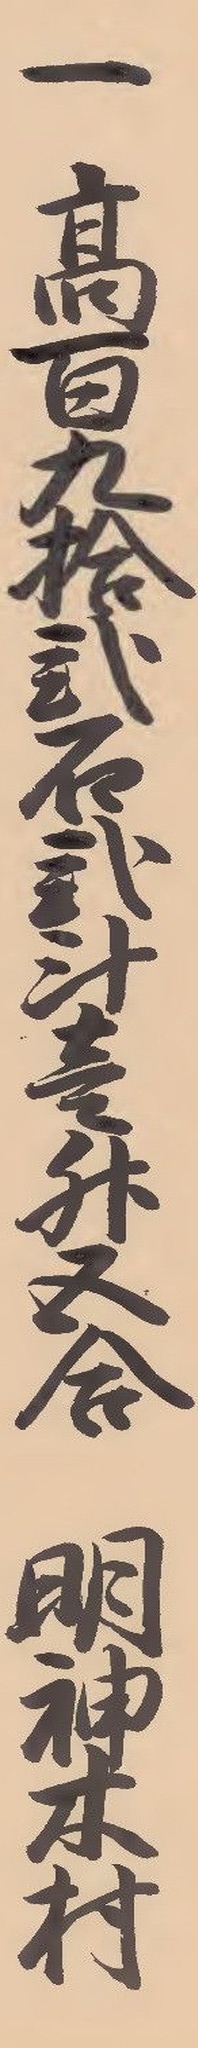一高百九拾弐石弐斗壱升五合明神木村
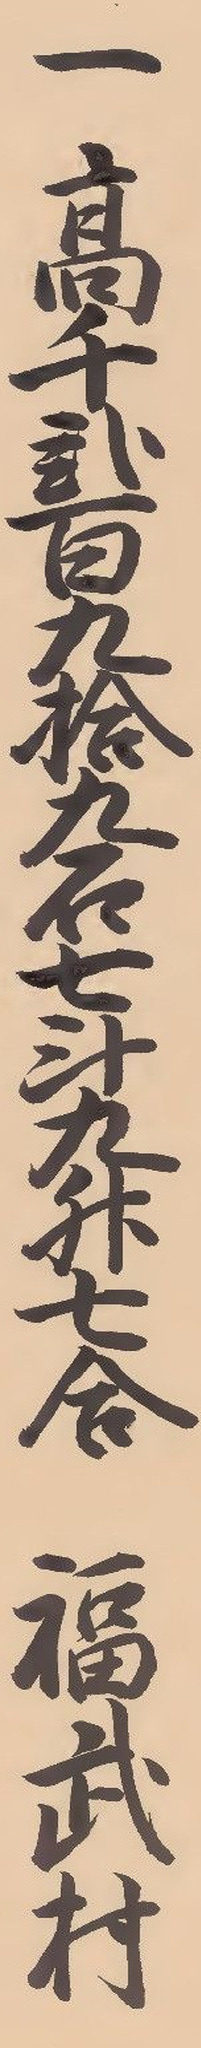一高千弐百九拾九石七斗九升七合福武村
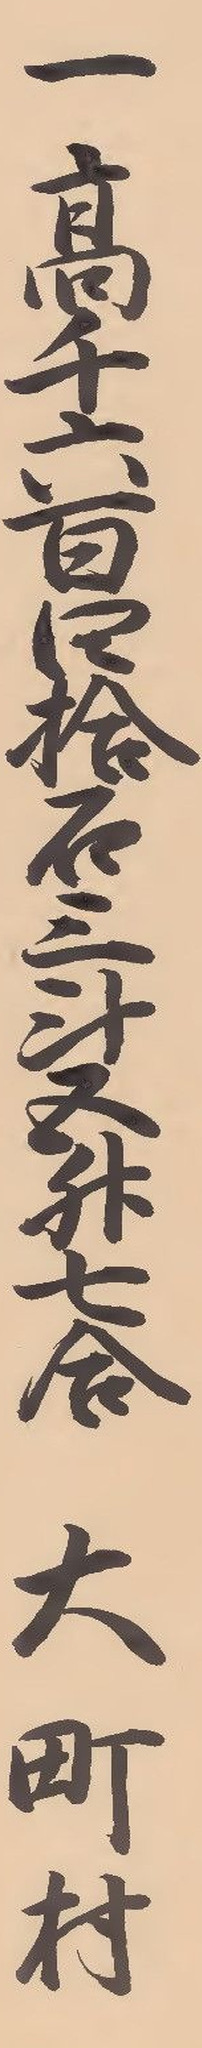一高千六百四拾石三斗五升七合大町村
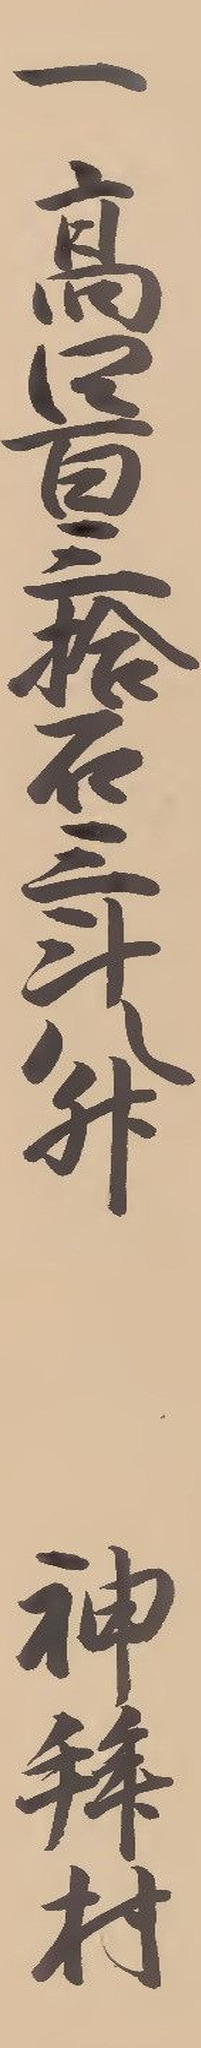一高四百三拾石三斗八升神拝村
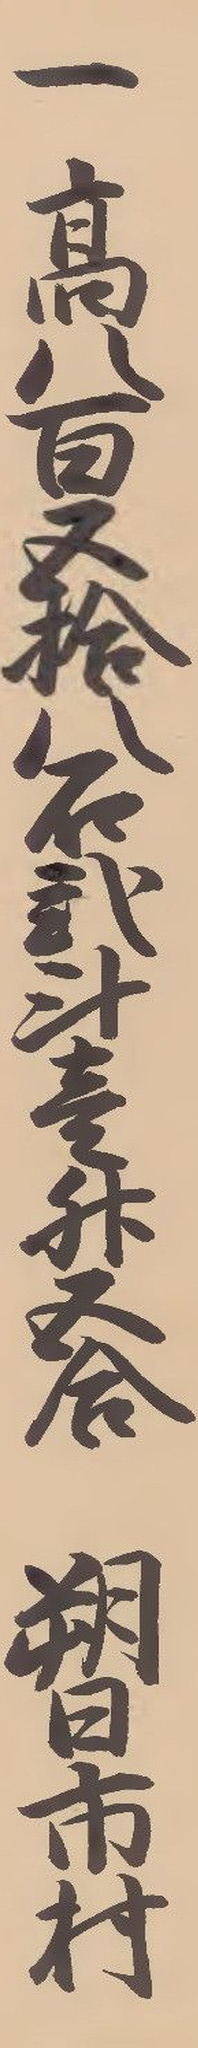一高八百五拾八石弐斗壱升五合朔日市村
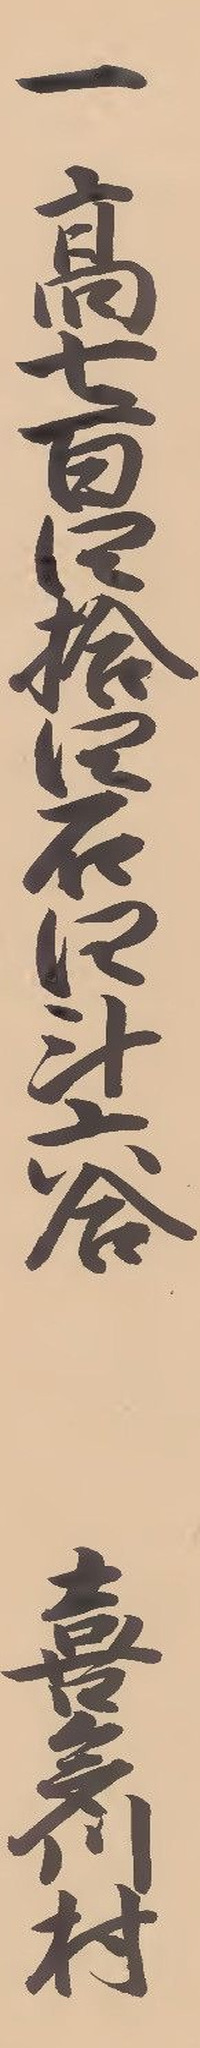一高七百四拾四石四斗六合喜多川村
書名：伊予国郷帳
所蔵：国立公文書館 National Archives of Japan
